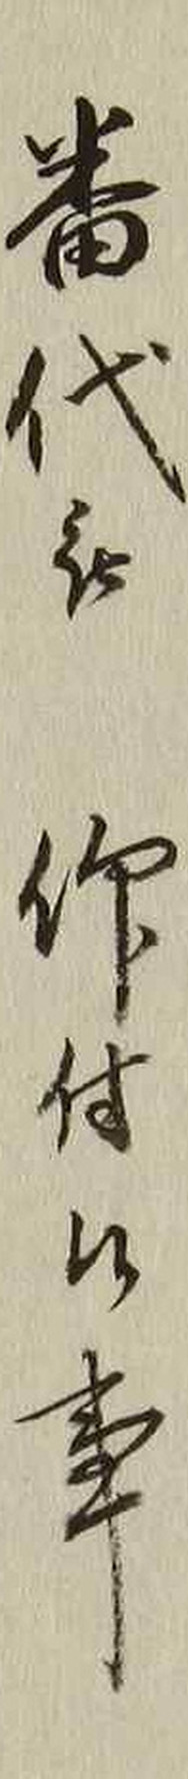番代被仰付候事
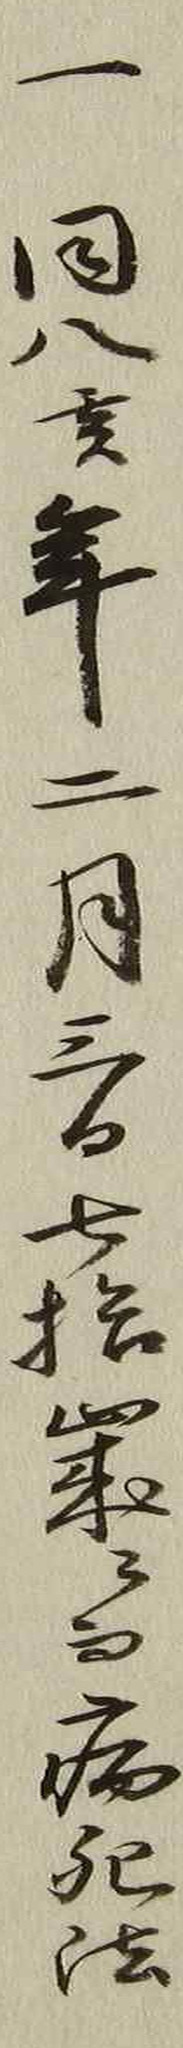一同八亥年二月三日七拾歳ニ而病死法
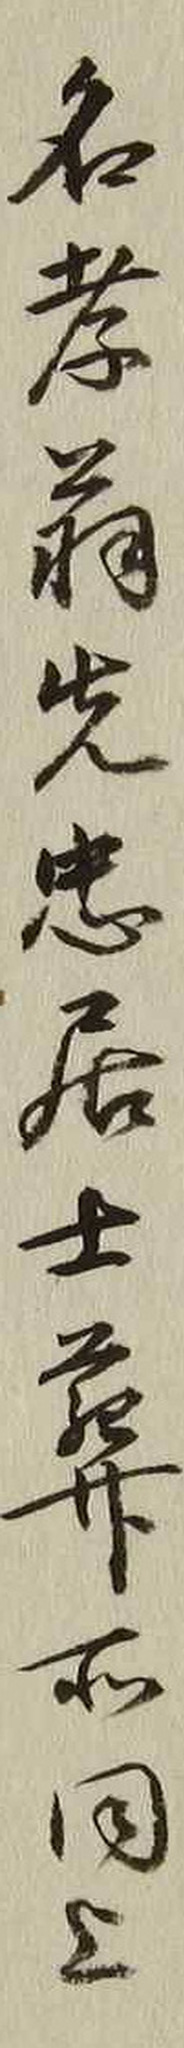名孝翁先忠居士葬所同上
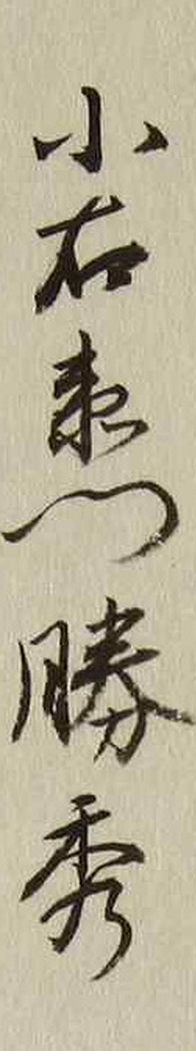小右衛門勝秀
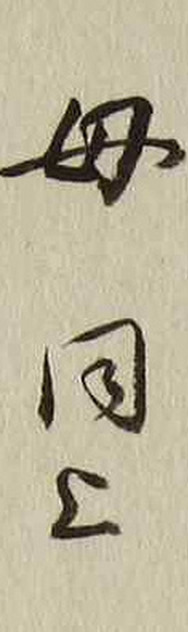母同上
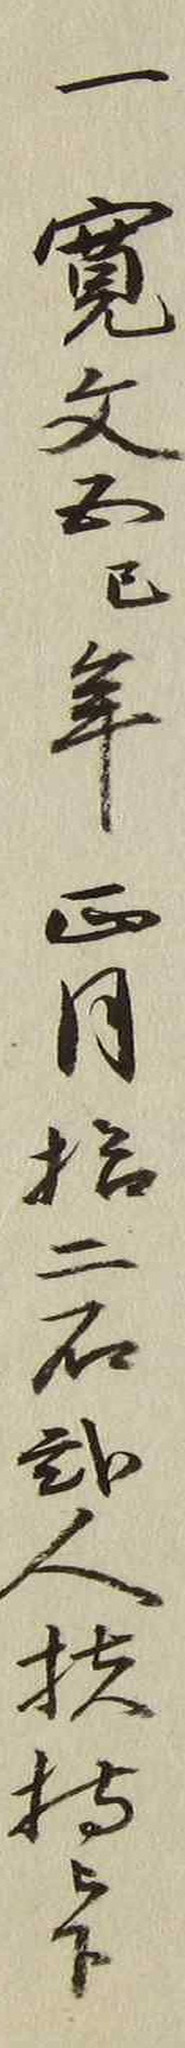一寛文五巳年正月拾二石弐人扶持被下
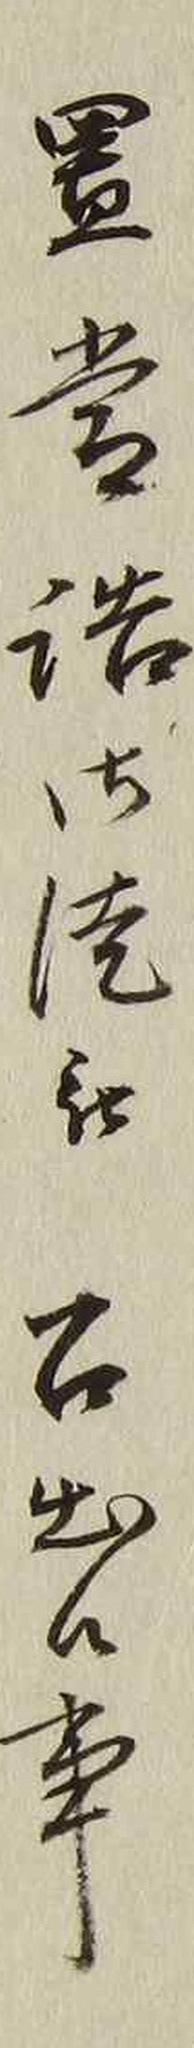置常詰御徒被召出候事
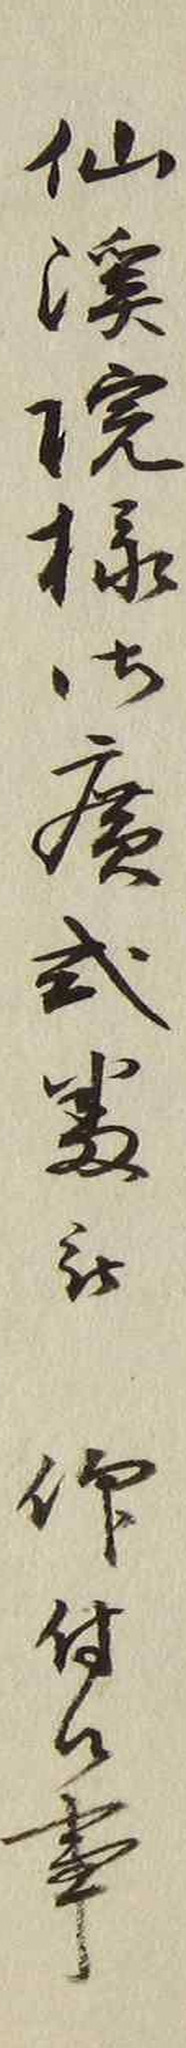仙渓院様御広式番被仰付候事
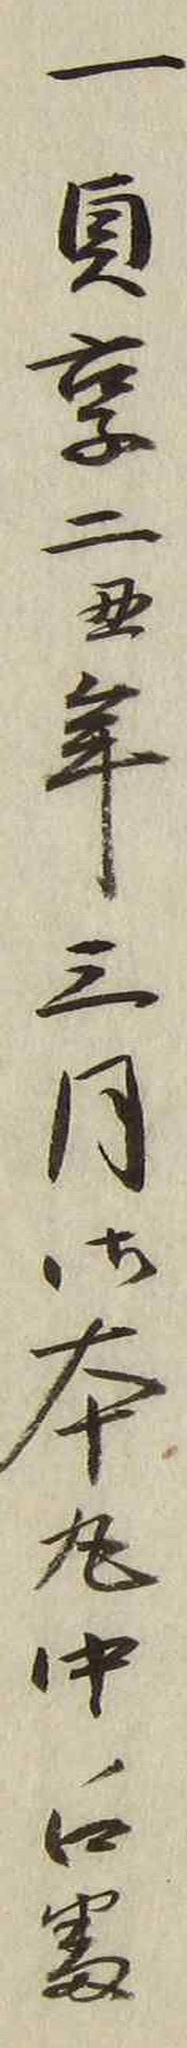一貞享二丑年三月御本丸中ノ口番

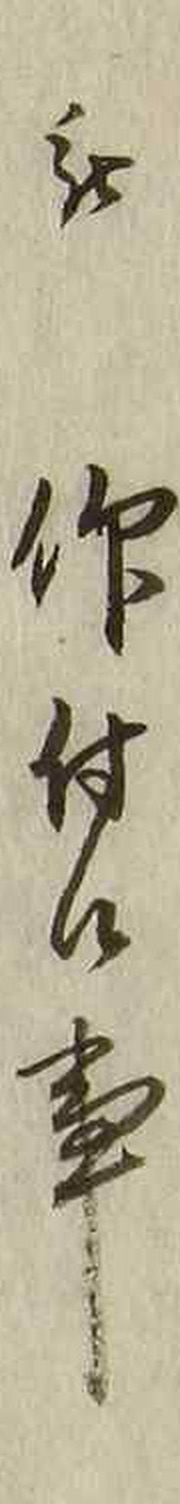被仰付候事
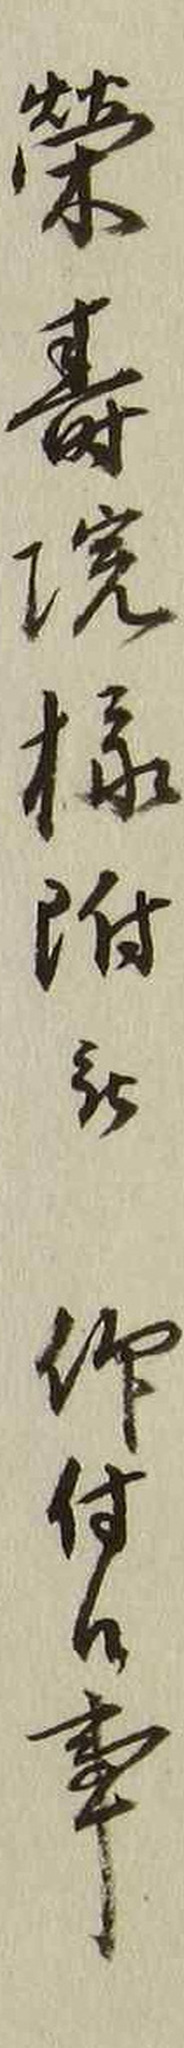栄寿院様附被仰付候事
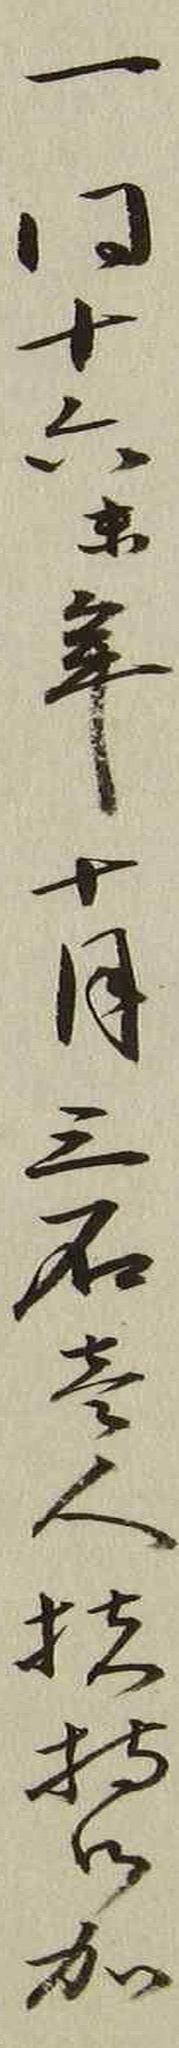一同十六未年十月三石壱人扶持候加
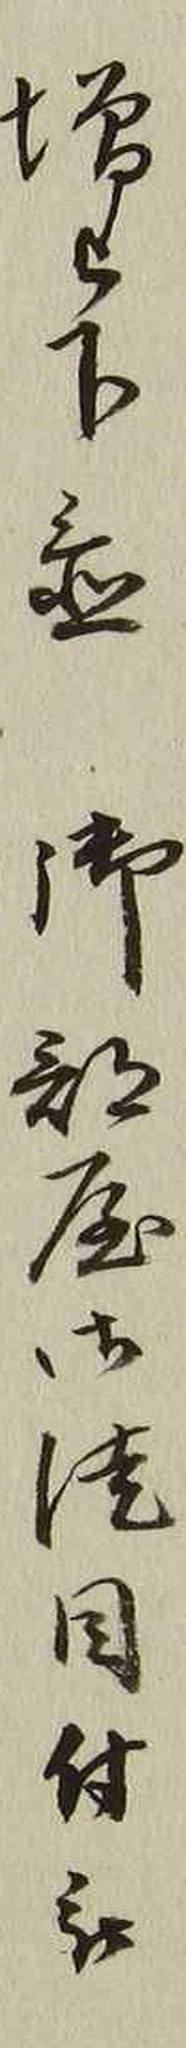増被下置御部屋御徒目付被
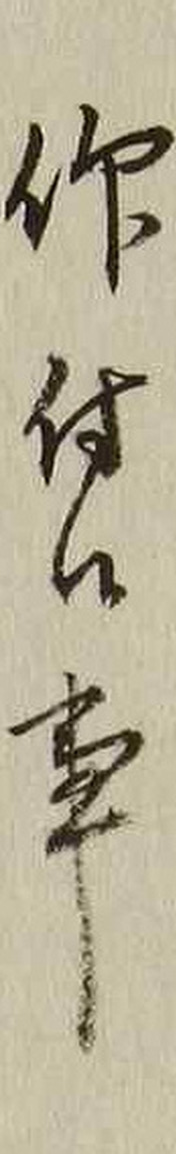仰付候事
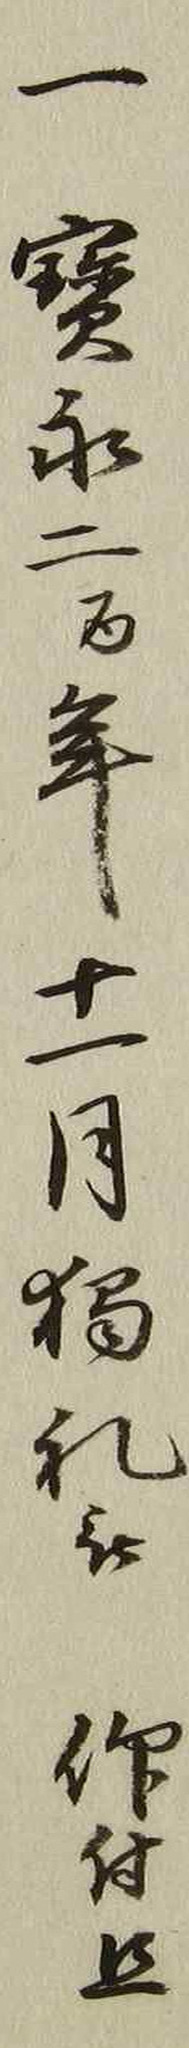一宝永二酉年十一月独礼被仰付且
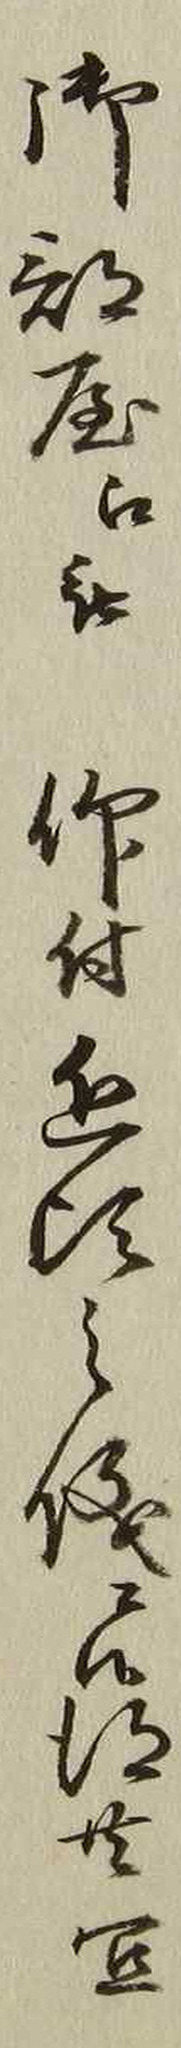御部屋江被仰付近頃之儀ニ候得共宜
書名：諸士系譜　巻之128　た之部4
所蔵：会津若松市立会津図書館
